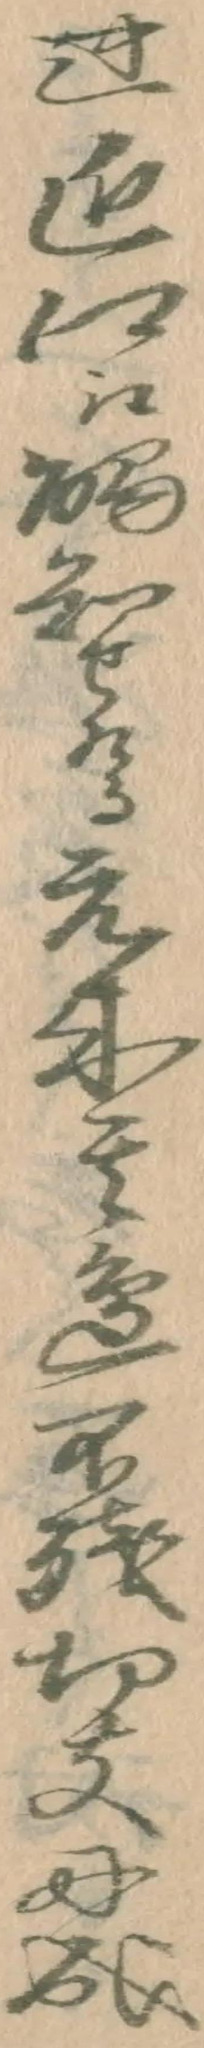迚近郷え触知せける元来其辺不残切支丹成

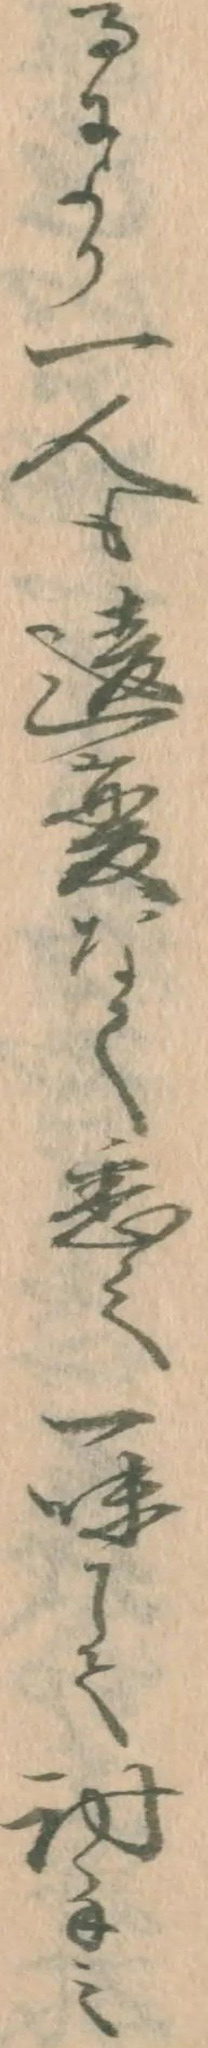るにより一人も違変なく悉く一味して討手之
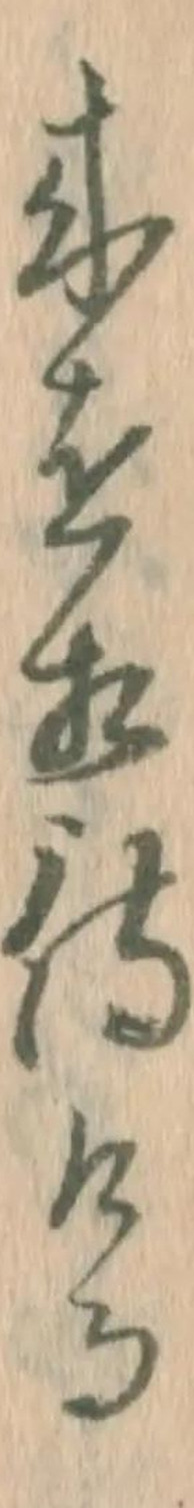来を相待ける

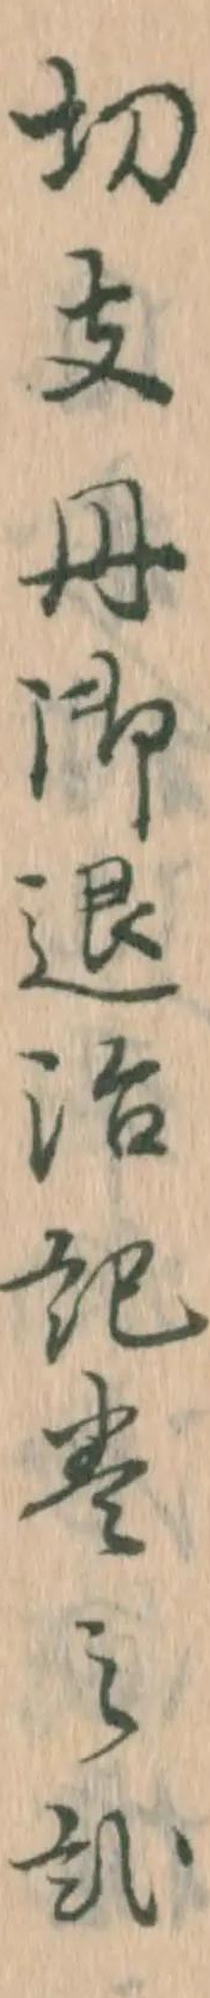切支丹退治記巻之弐
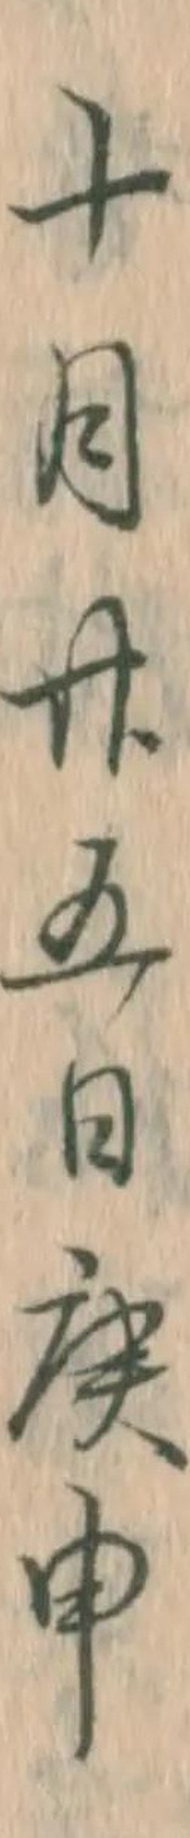十月廿五日庚申
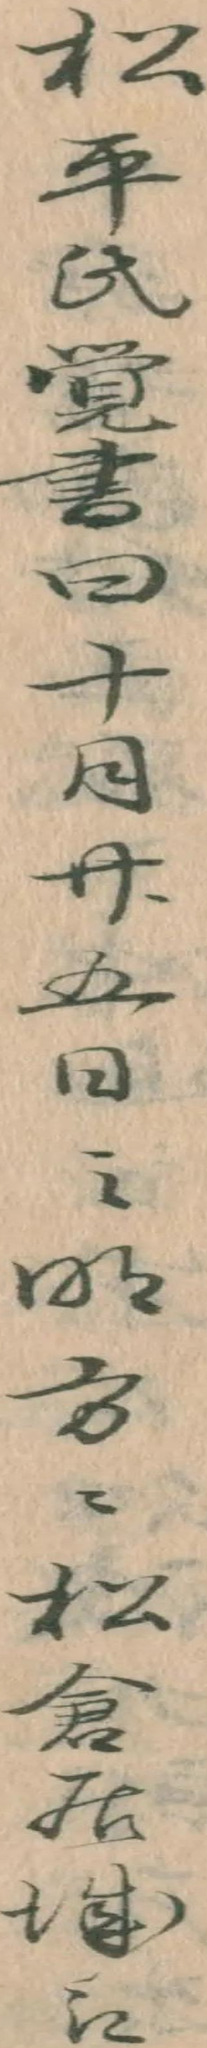松平氏覚書日十月廿五日之明方に松倉居城え
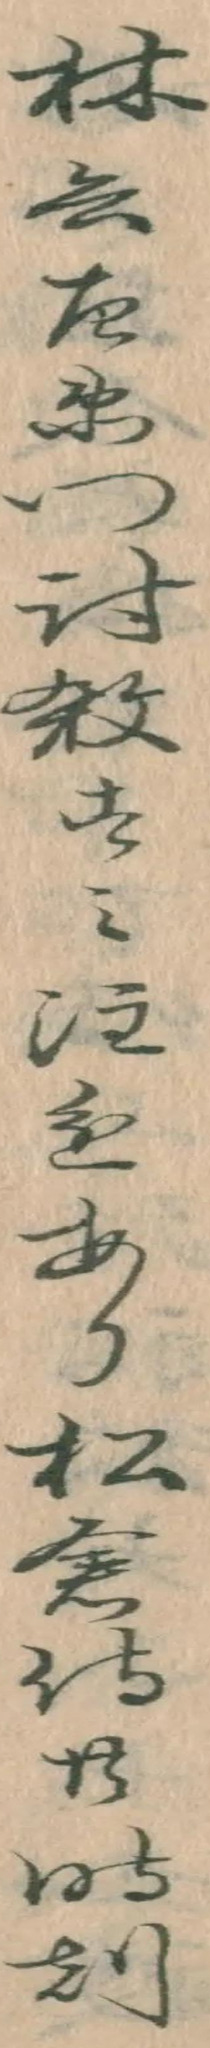林兵左衛門討殺す之注進あり松倉侍共時刻
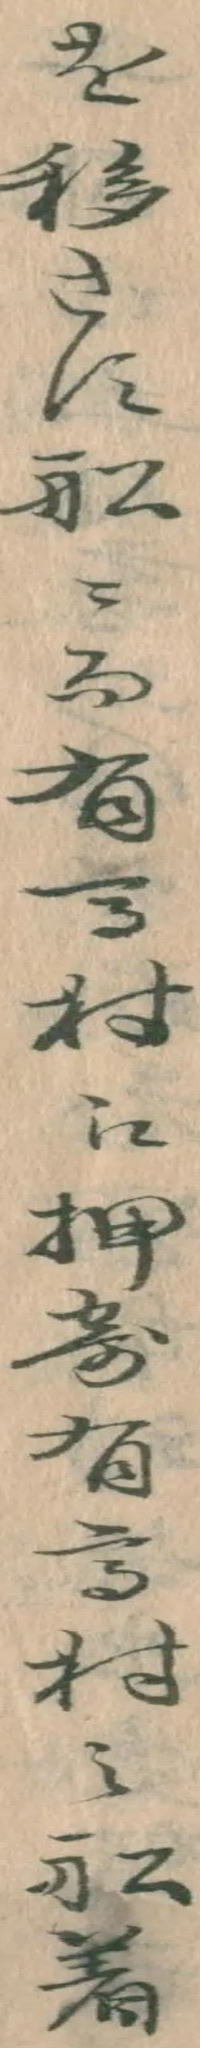を移さす船に而有馬村え押寄有馬村之船着
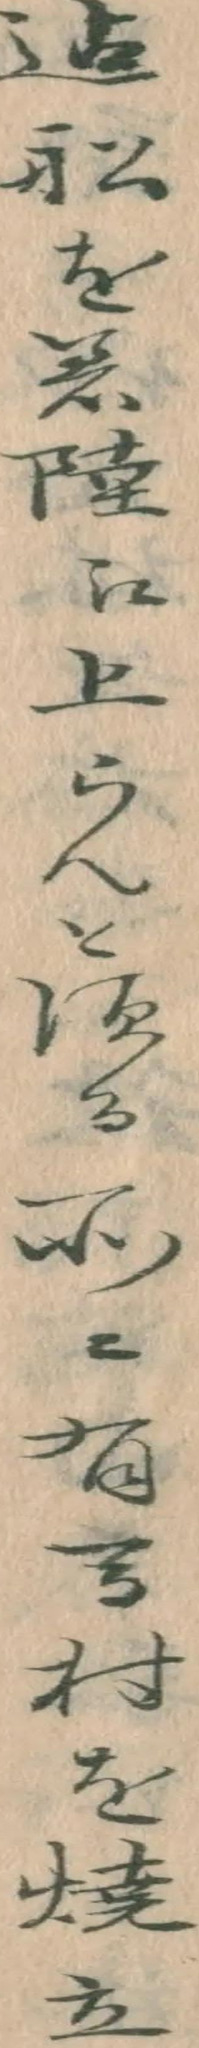迄船を着陸え上らんとする所に有馬村を焼立
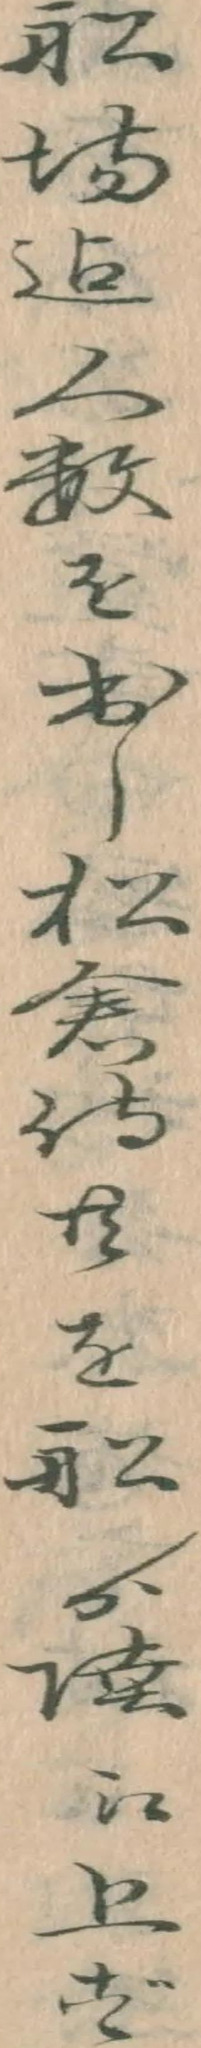船場迄人数を出し松倉侍共を船ゟ陸え上ず
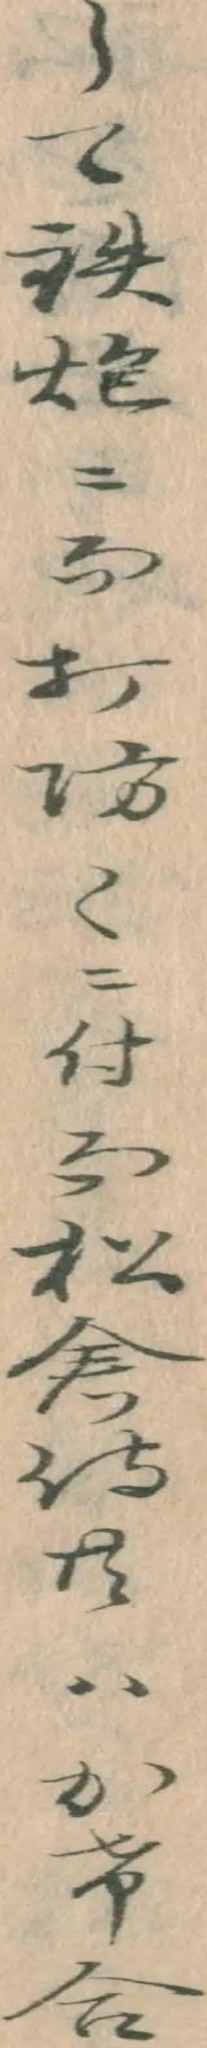して鉄炮に而打防くに付而松倉侍共はかけ合
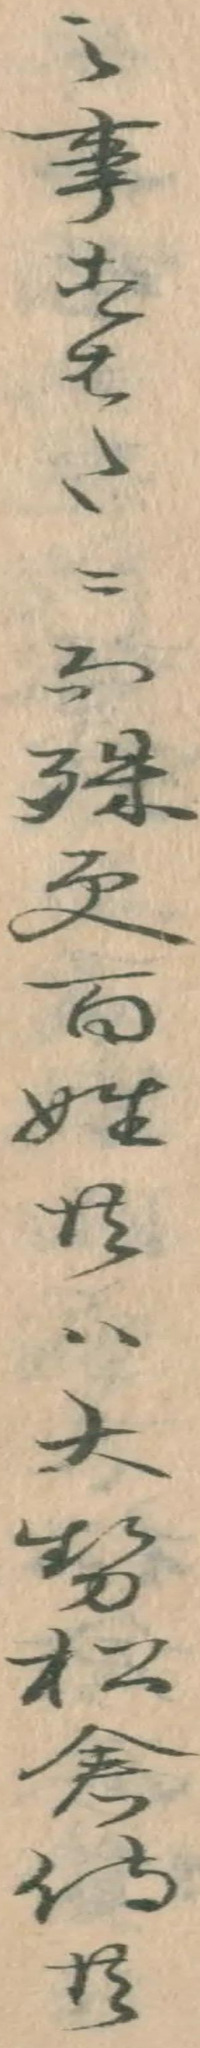之事すはたに而殊更百姓共は大勢松倉侍共

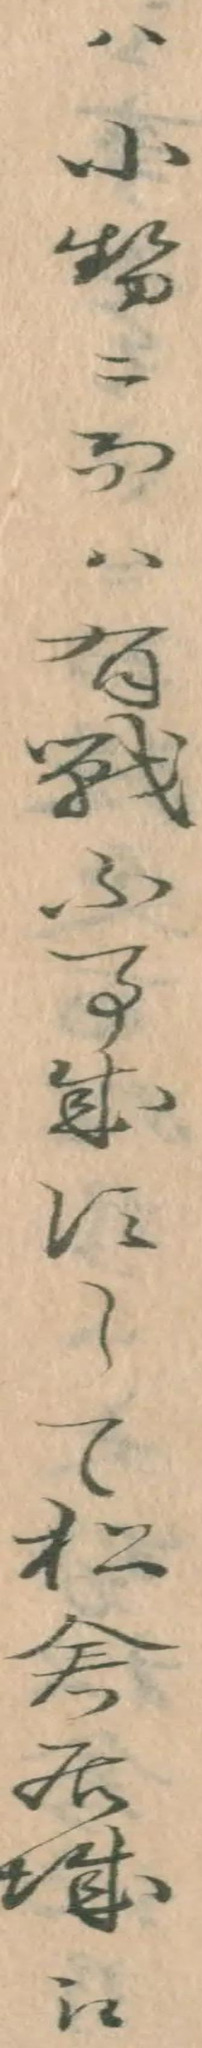は小勢に而は有戦ふ事成すして松倉居城え
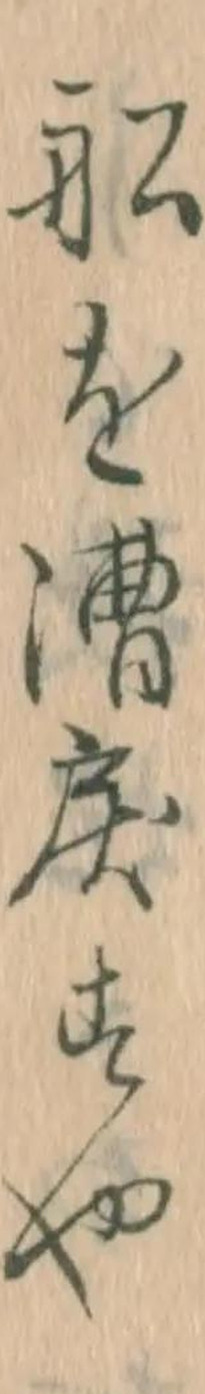船を漕戻す也
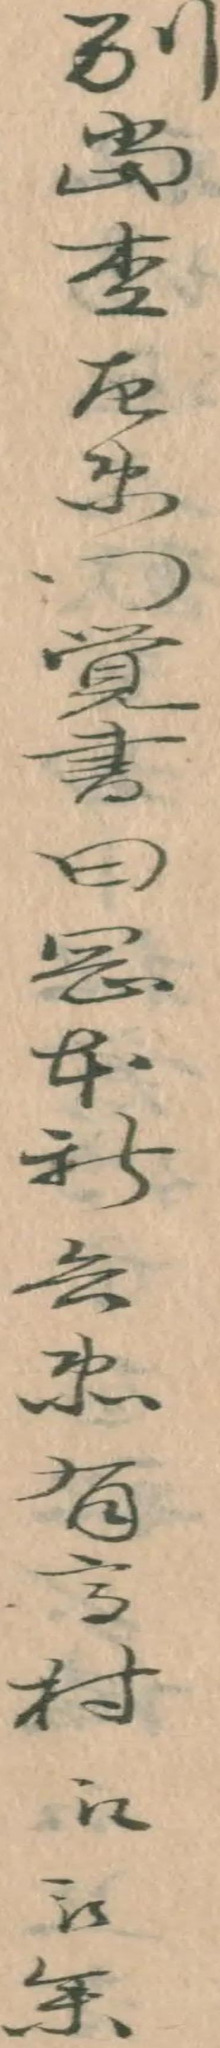別当杢左衛門覚書日岡本新兵衛有馬村え被参
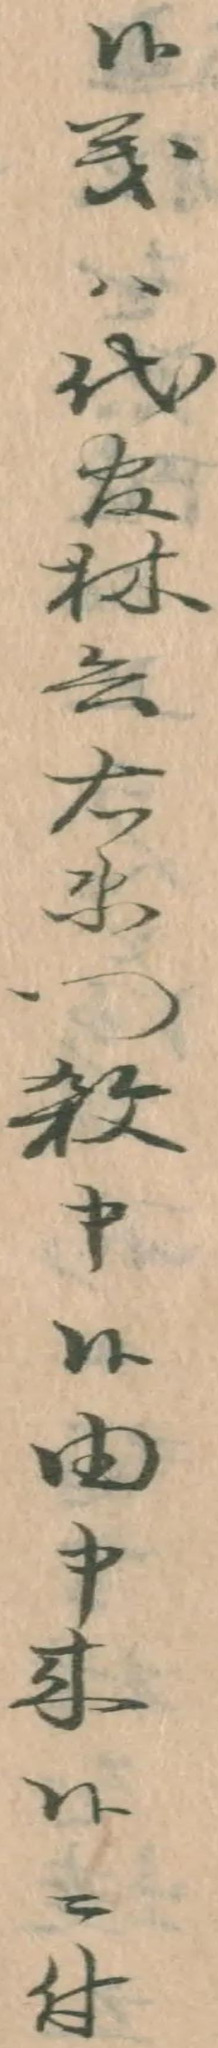候義は代官林兵右衛門殺申候由申来候に付
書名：切支丹御退治記 49巻. [1]
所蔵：国立国会図書館 National Diet Library, JAPAN
